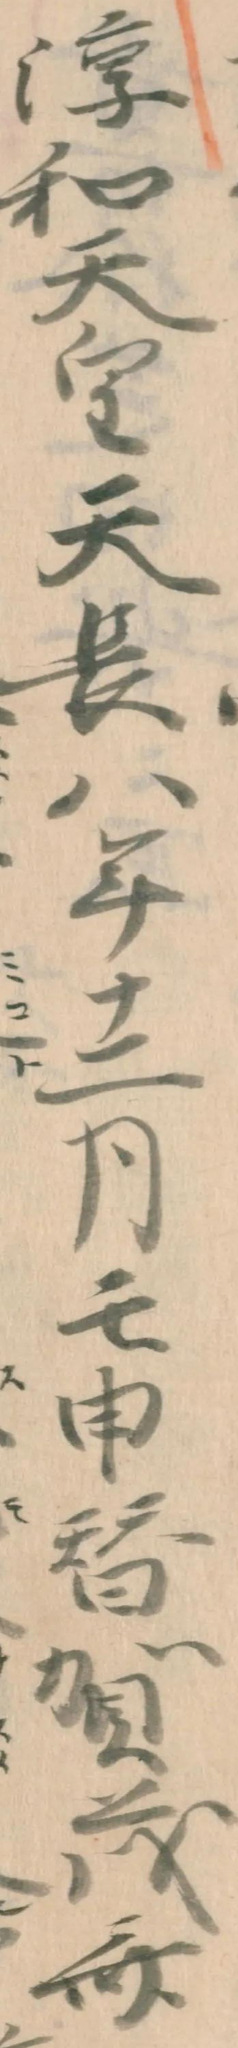淳和天皇天長八年十二月壬申替賀茂斎
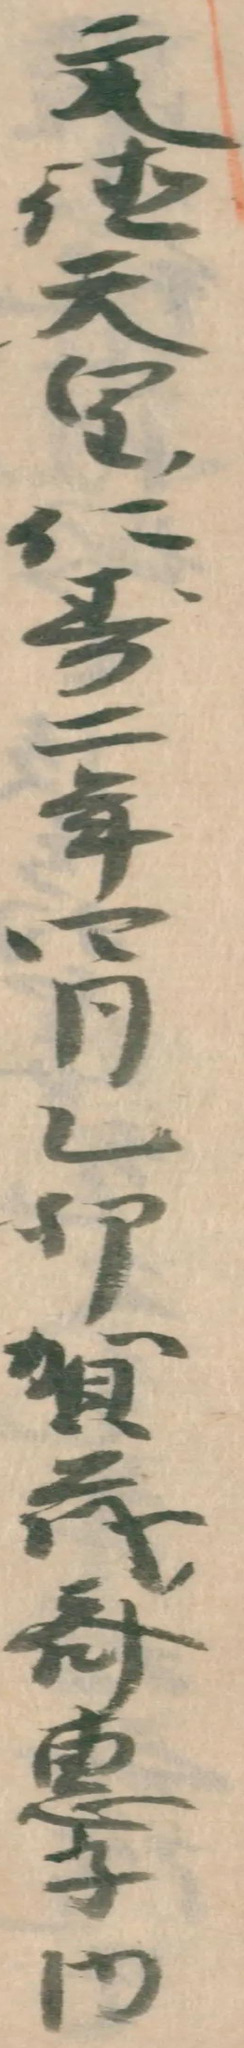文徳天皇仁寿二年四月乙卯賀茂斎恵-子内

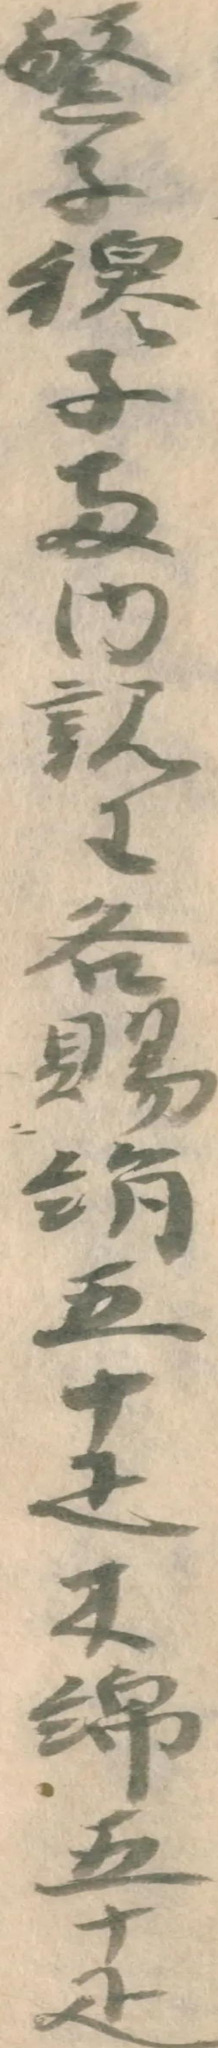繁子穆子両内親王各賜絹五十疋木綿五十疋
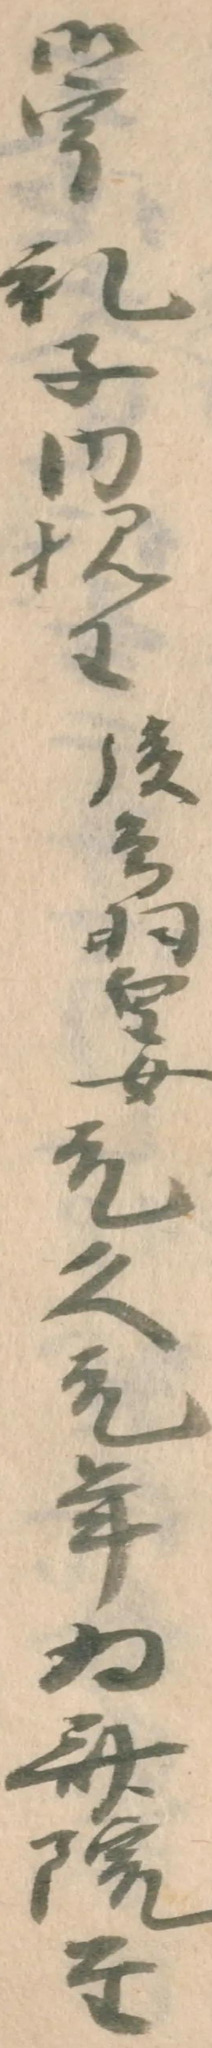御宇礼子内親王後鳥羽皇女元久元年為斎院至
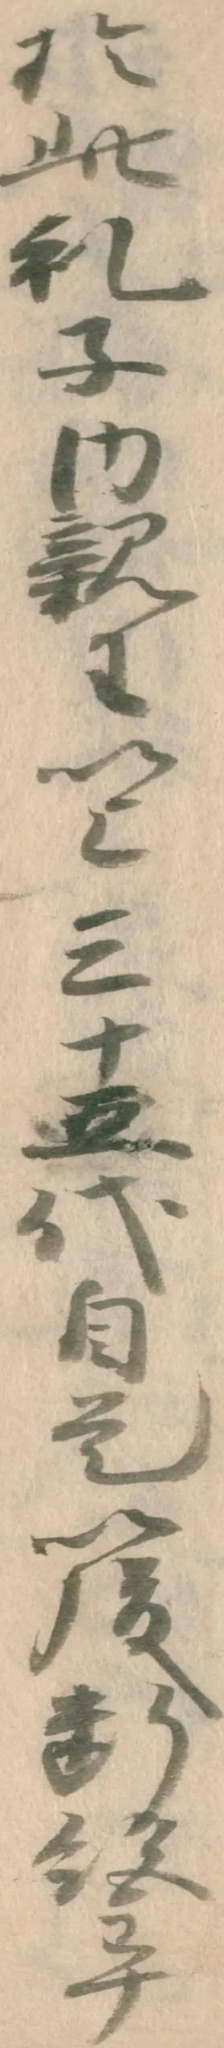於此礼子内親王以上三十五代自是以後断絶畢
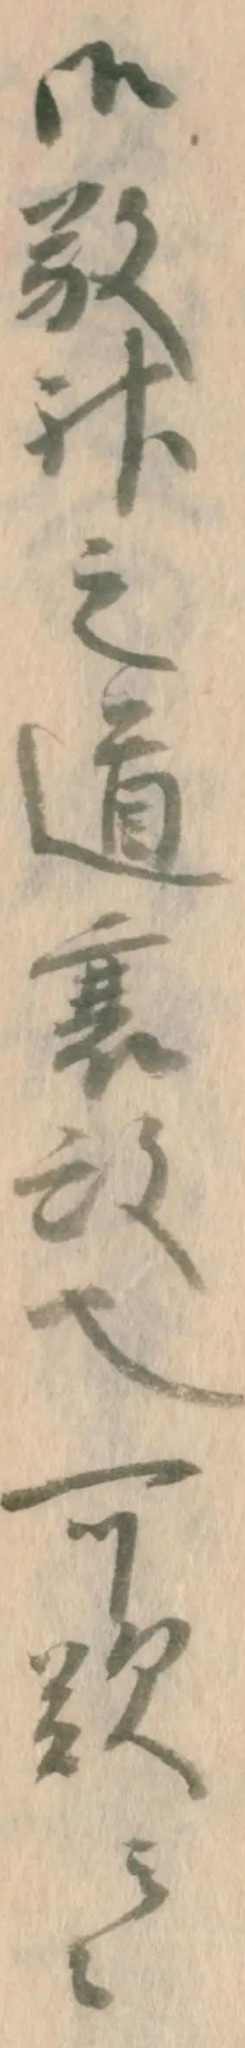御敬神之道衰故也可歎云々
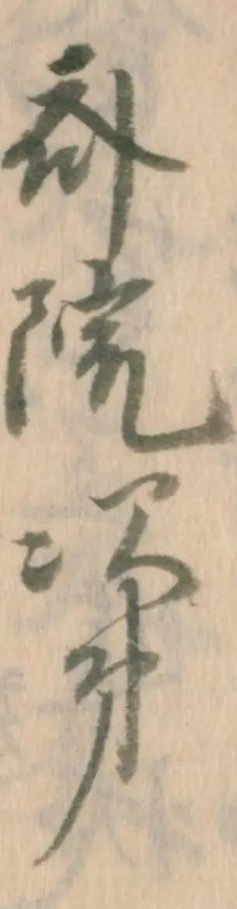斎院次第

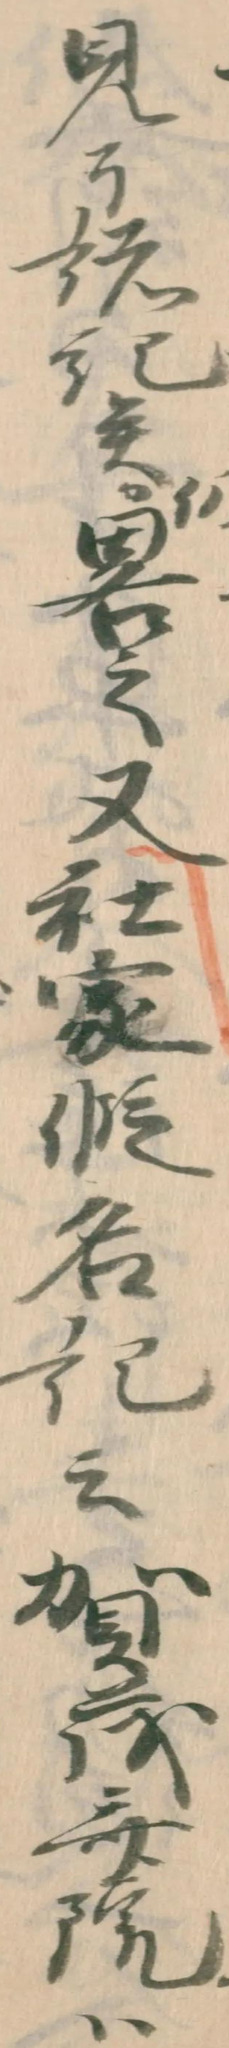見于諸記矣◦略之又社家仮名記云賀茂斎院は
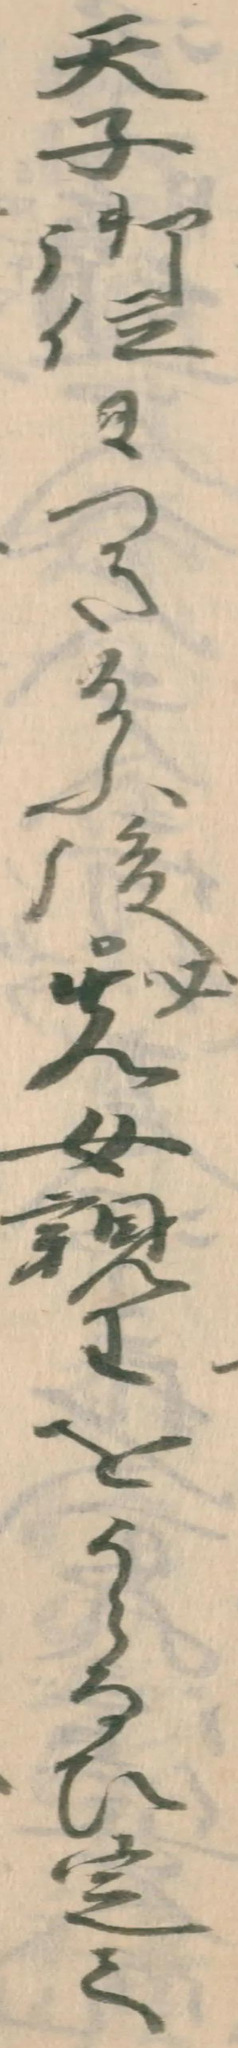天子御位につき給ふ後◦先女親王をうらなひ定て
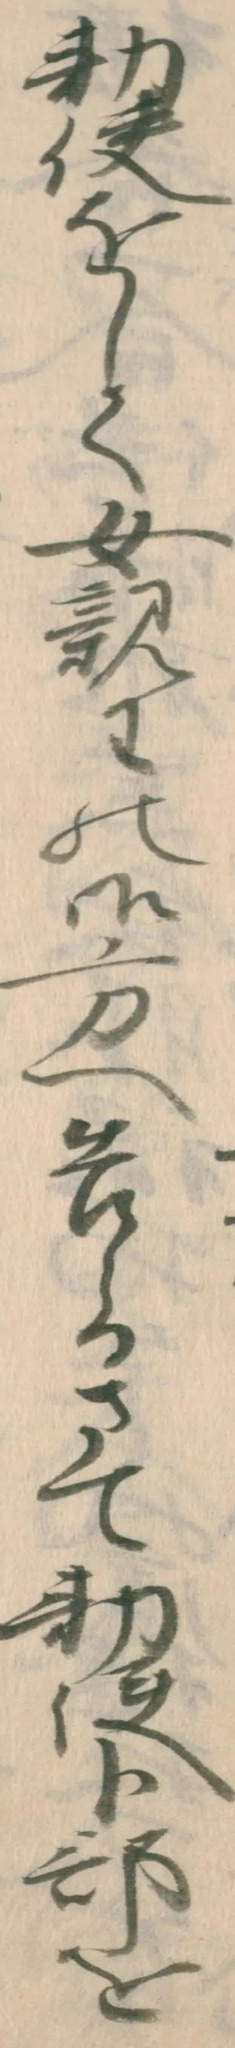勅使をして女親王の御方へ告らるさて勅使卜部を
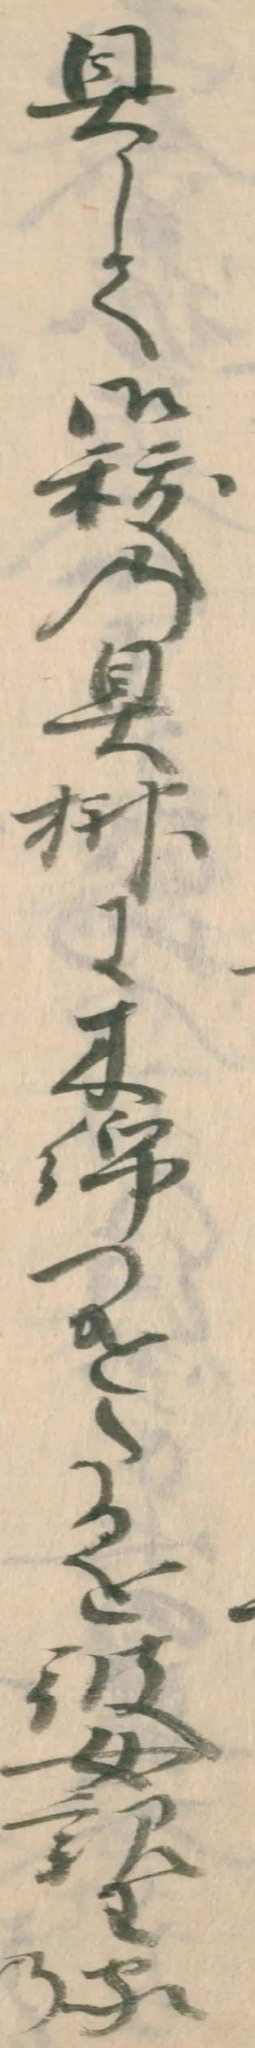具して御祓の具榊に木綿つけたるを彼女親王家の
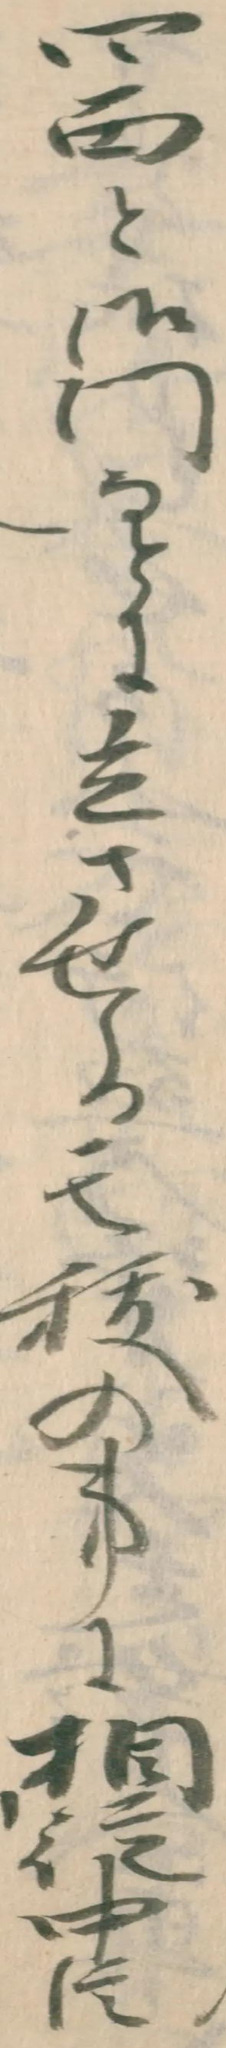四面と御門なとに立させらる其祓の事に相-従中臣
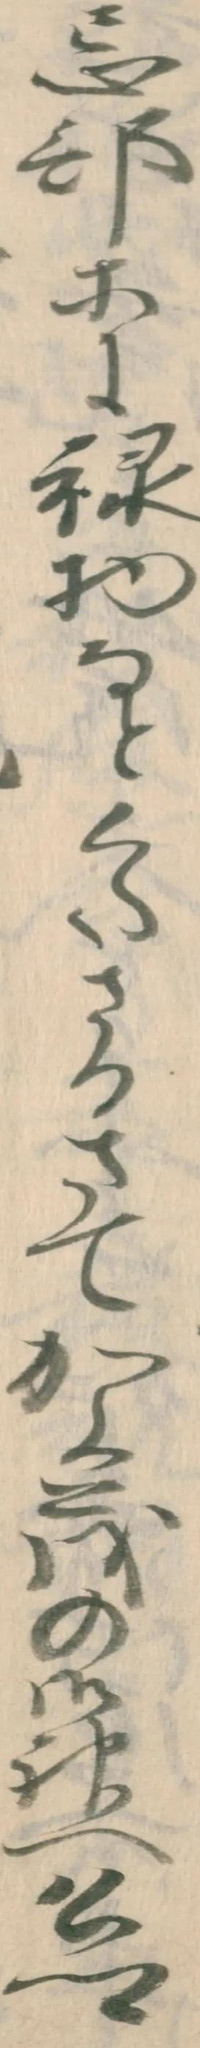忌部等に禄物なとくたさるさて賀茂の御神へ公卿
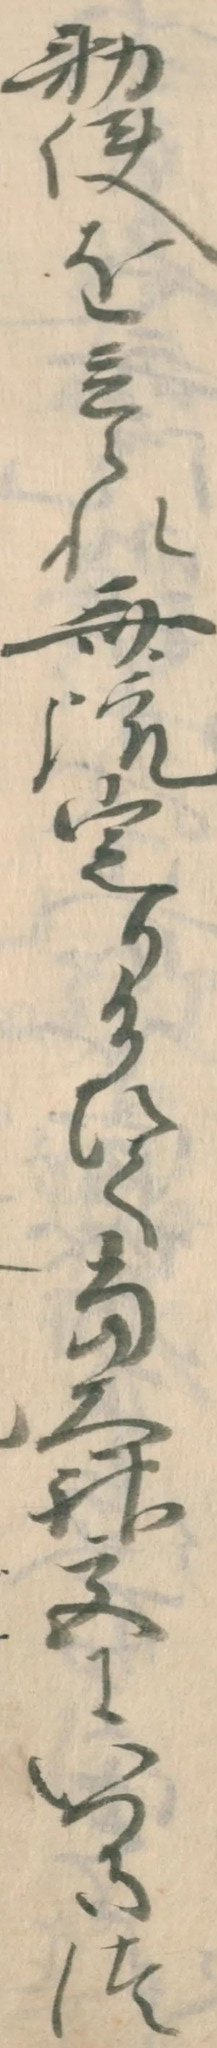勅使を立られ斎院定り給ひて当太神宮にいつきつ
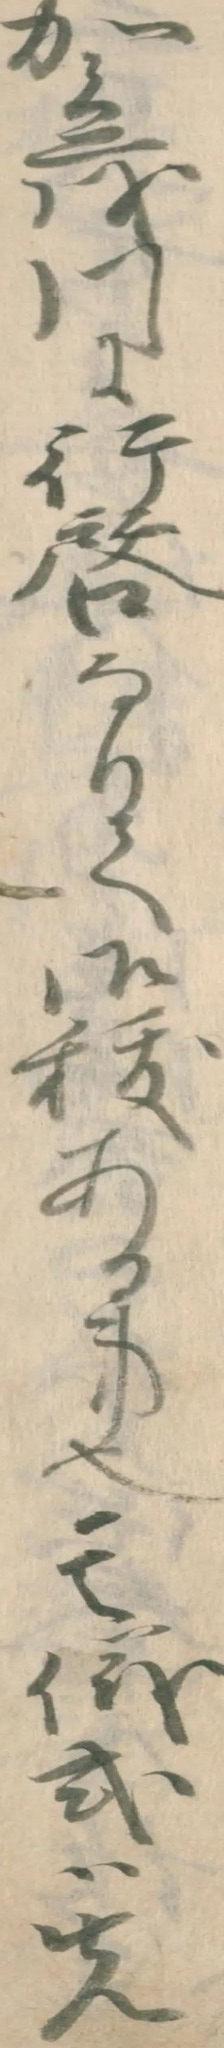賀茂川に行啓なりて御祓ある事也其儀式は先

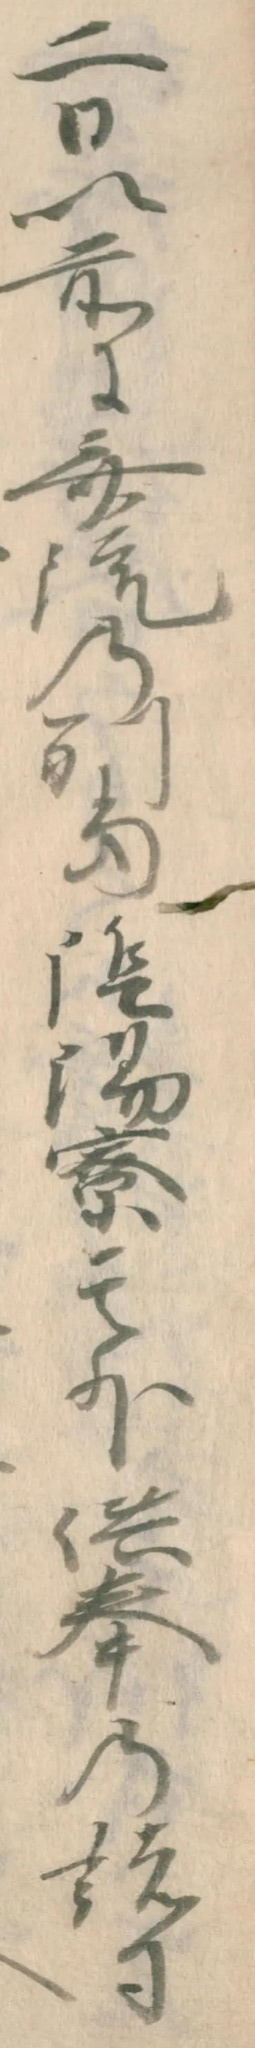二日以前に斎院の別当陰陽寮其外供奉の諸司
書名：賀茂社記録. 第1冊
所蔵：国立国会図書館 National Diet Library, JAPAN
